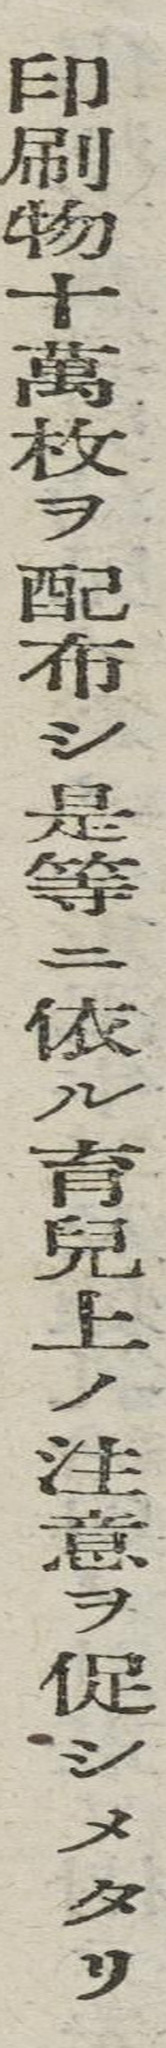印刷物十万枚ヲ配布シ是等ニ依ル育児上ノ注意ヲ促シメタリ
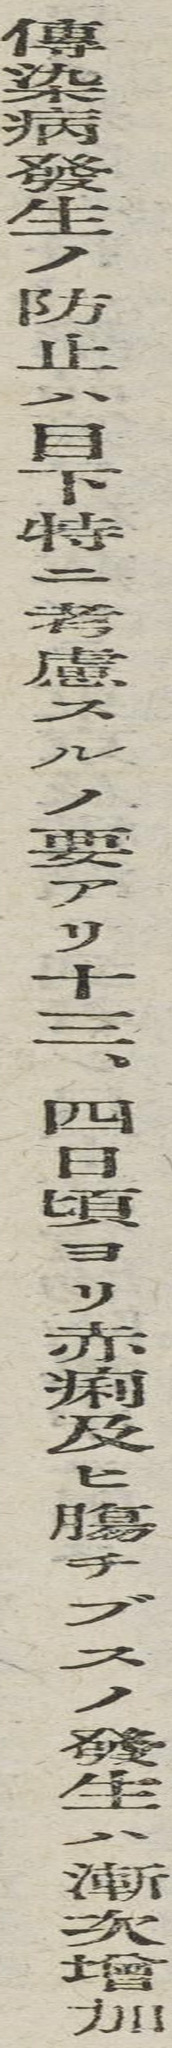伝染病発生ノ防止ハ目下特ニ考慮スルノ要アリ十三、四日頃ヨリ赤痢及ヒ腸チブスノ発生ハ漸次増加
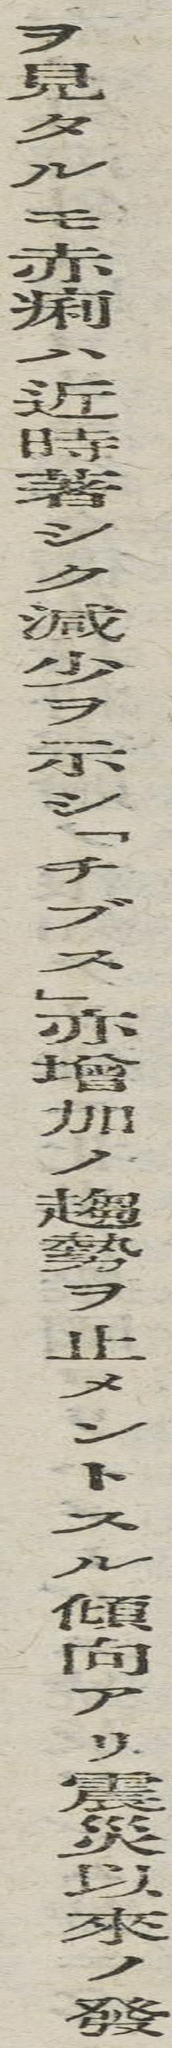ヲ見タルモ赤痢ハ近時著シク減少ヲ示シ「チブス」亦増加ノ趨勢ヲ止メントスル傾向アリ震災以来ノ発
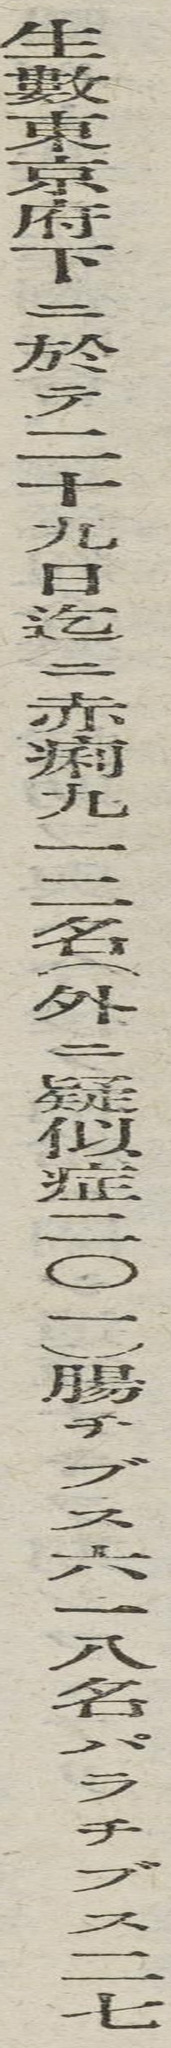生数東京府下ニ於テ二十九日迄ニ赤痢九一二名腸チブス六一八名パラチブス二七
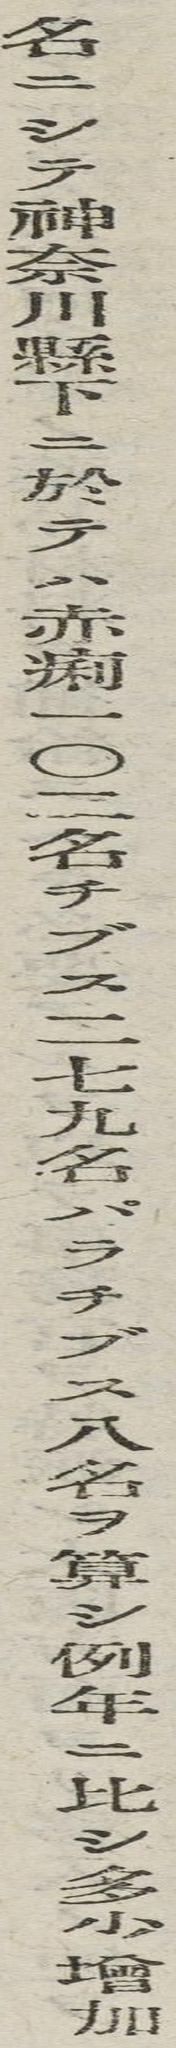名ニシテ神奈川県下ニ於テハ赤痢一〇二名チブス二七九名パラチブス八名ヲ算シ例年ニ比シ多少増加
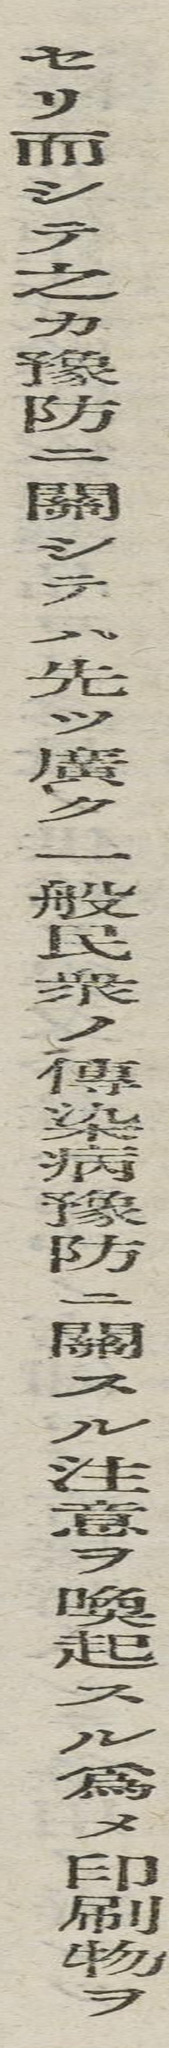セリ而シテ之カ予防ニ関シテハ先ツ広ク一般民衆ノ伝染病予防ニ関スル注意ヲ喚起スル為メ印刷物ヲ
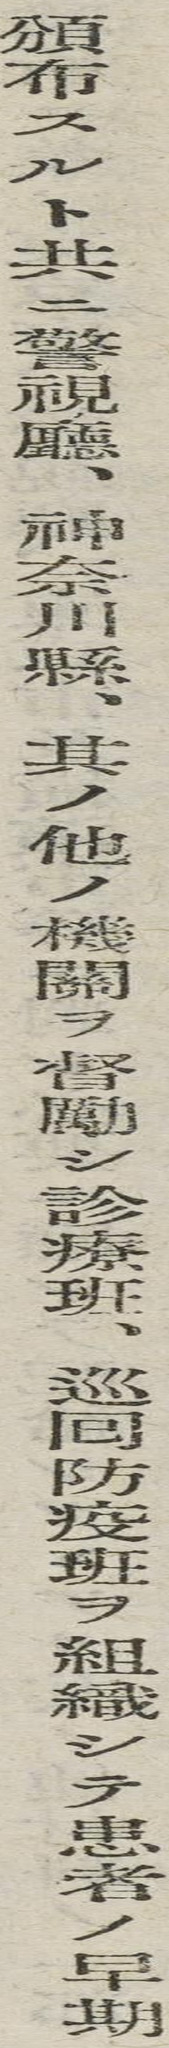頒布スルト共ニ警視庁、神奈川県、其ノ他ノ機関ヲ督励シ診療班、巡回防疫班ヲ組織シテ患者ノ早期
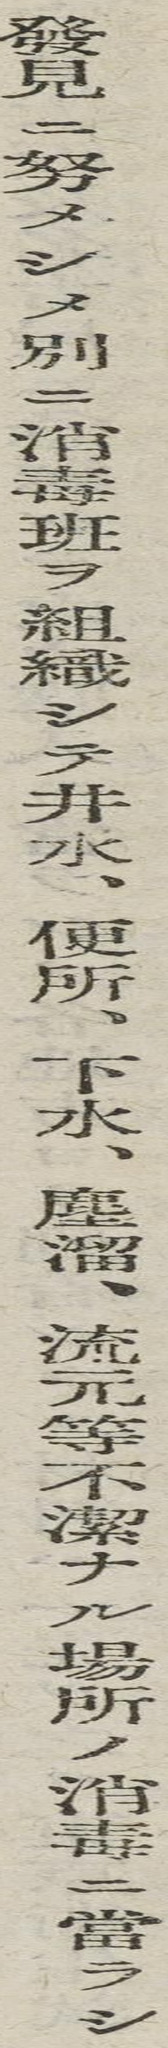発見ニ努メシメ別ニ消毒班ヲ組織シテ井水、便所、下水、塵溜、流元等不潔ナル場所ノ消毒ニ当ラシ
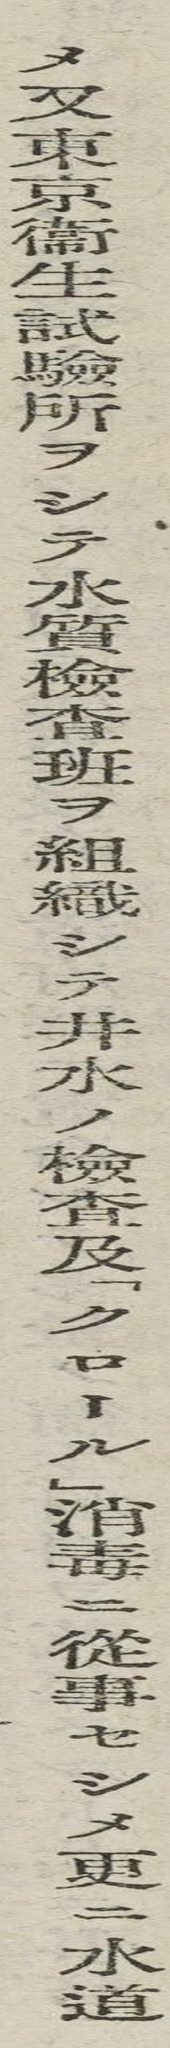メ又東京衛生試験所ヲシテ水質検査班ヲ組織シテ井水ノ検査及「クロール」消毒ニ従事セシメ更ニ水道
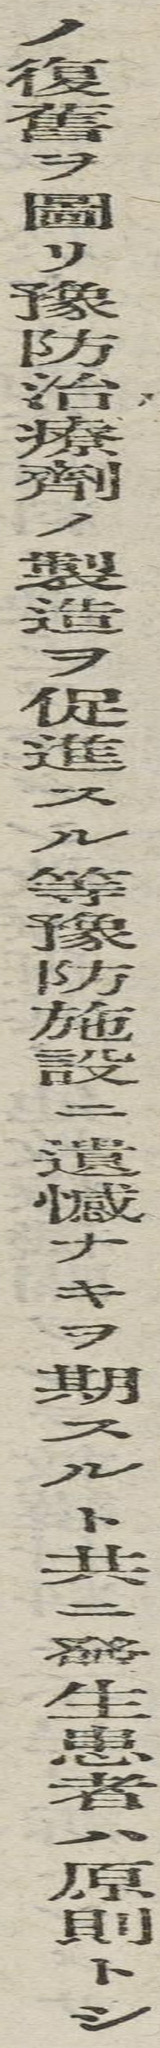ノ復旧ヲ図リ予防治療剤ノ製造ヲ促進スル等予防施設ニ遺憾ナキヲ期スルト共ニ発生患者ハ原則トシ
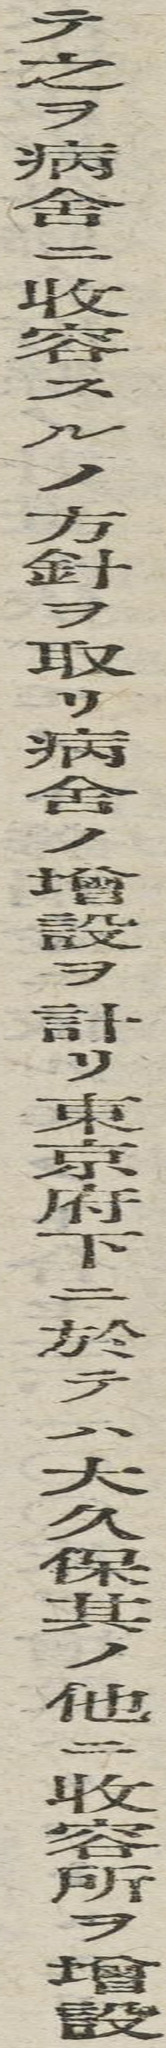テ之ヲ病舎ニ収容スルノ方針ヲ取リ病舎ノ増設ヲ計リ東京府下ニ於テハ大久保其ノ他ニ収容所ヲ増設
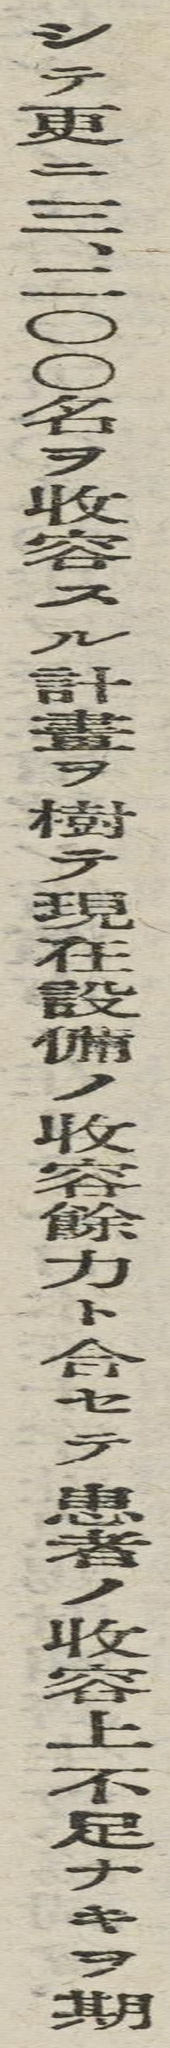シテ更ニ三、二〇〇名ヲ収容スル計画ヲ樹テ現在設備ノ収容余力ト合セテ患者ノ収容上不足ナキヲ期
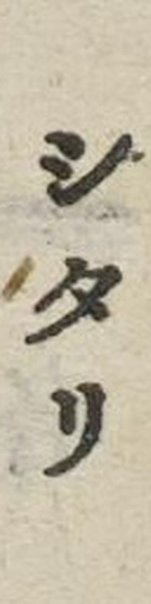シタリ
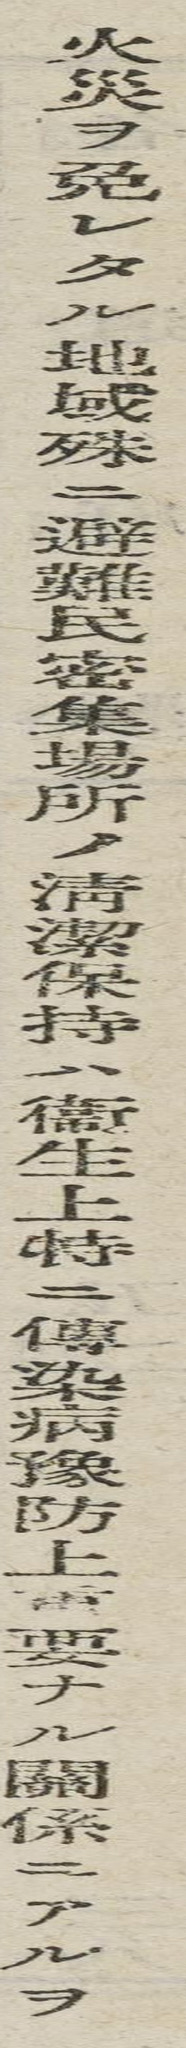火災ヲ免レタル地域殊ニ避難民密集場所ノ清潔保持ハ衛生上特ニ伝染病予防上重要ナル関係ニアルヲ
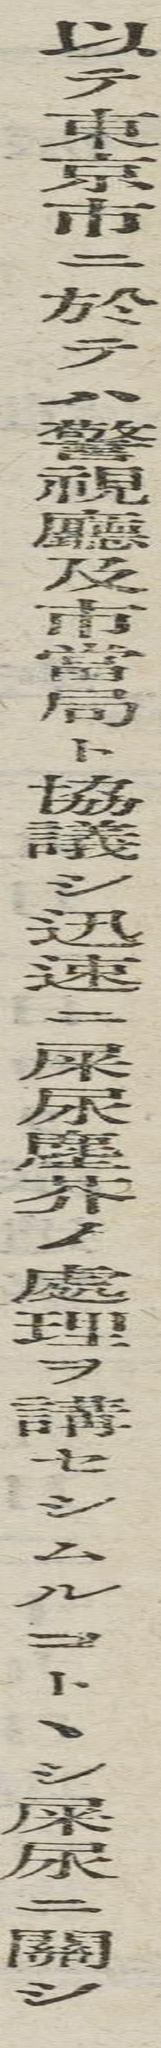以テ東京市ニ於テハ警視庁及市営局ト協議シ迅速ニ屎尿塵芥ノ処理ヲ講セシムルコトヽシ屎尿ニ関シ
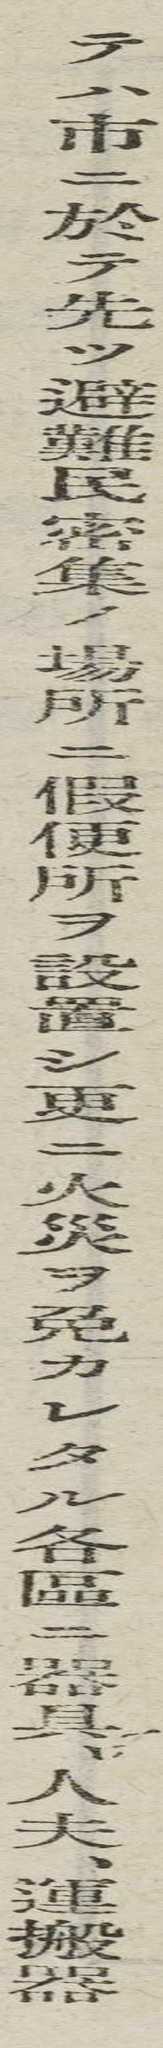テハ市ニ於テ先ツ避難民密集ノ場所ニ仮便所ヲ設置シ更ニ火災ヲ免カレタル各区ニ器具、人夫、運搬器
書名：震災被害状況並救護施設概要
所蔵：東京大学地震研究所図書室 Earthquake Research Institute Library, The University of Tokyo, JAPAN
